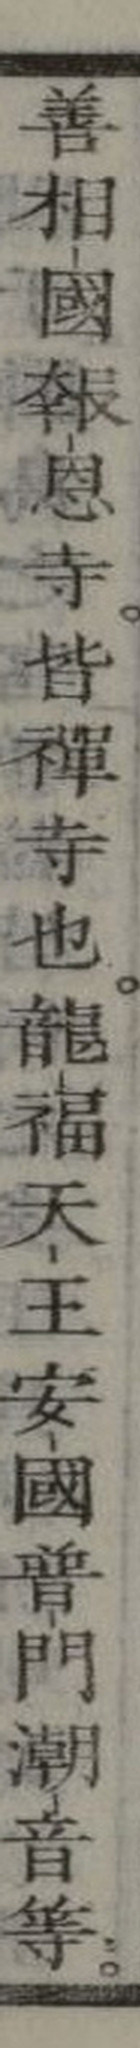善相-國報-恩寺。皆襌寺也。龍-福天-王安-國普-門潮-音等。
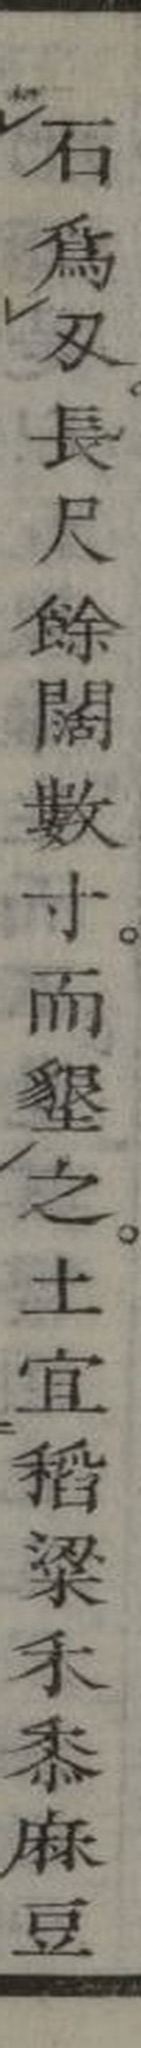石爲刃。長尺餘闊數寸。而墾之。土宜稻粱禾黍麻豆

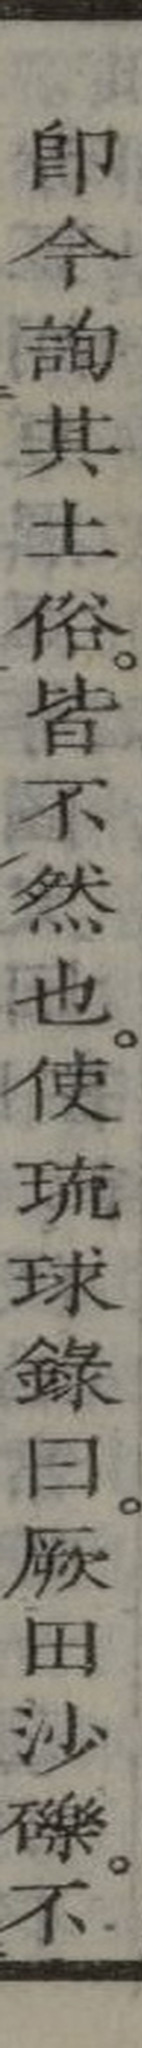卽今詢其土俗。皆不然也。使琉球錄曰。厥田沙礫。不
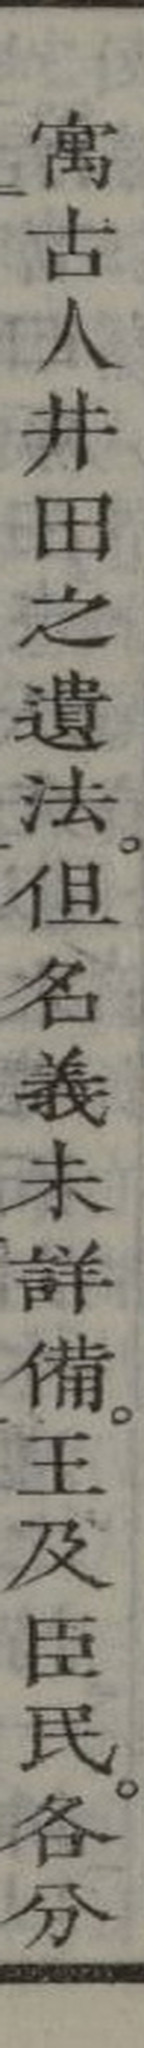寓古人井田之遺法。但名義未詳備。王及臣民。各分
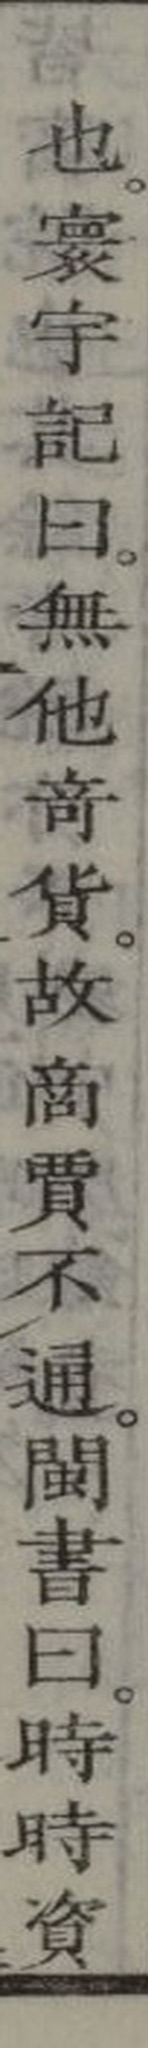也。寰宇記曰。無他竒貨。故商賈不通。閩書曰。時時資
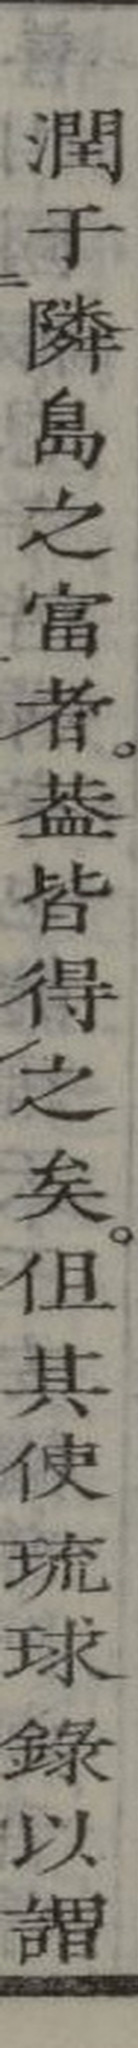潤于隣島之富者。葢皆得之矣。但其使琉球錄以謂
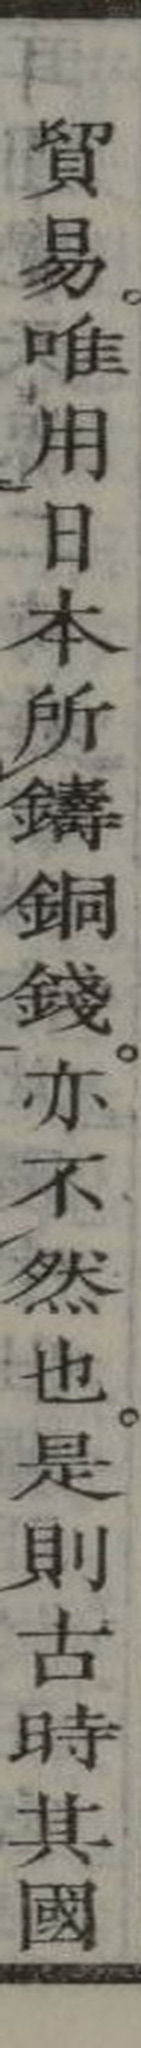貿易。唯用日本所鑄銅錢。亦不然也。是則古時其國
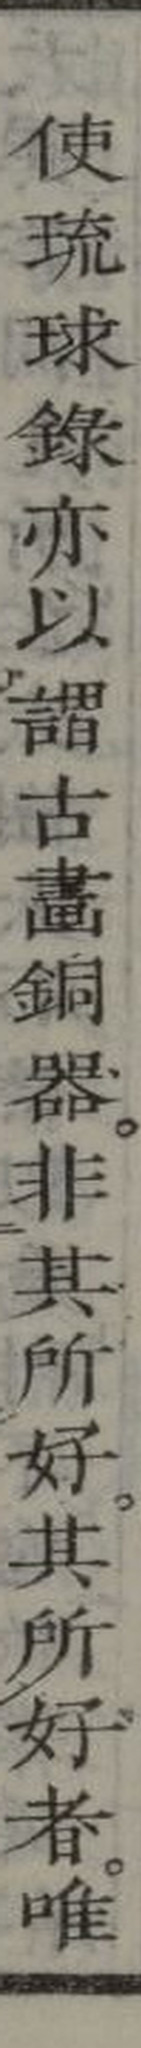使琉球錄亦以謂古畵銅器。非其所レ好。其所好者。唯
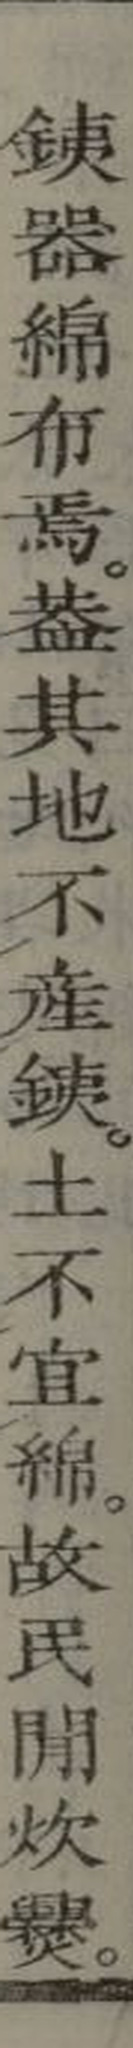銕器綿布焉。葢其地不産銕。土不宜綿。故民閒炊爨。
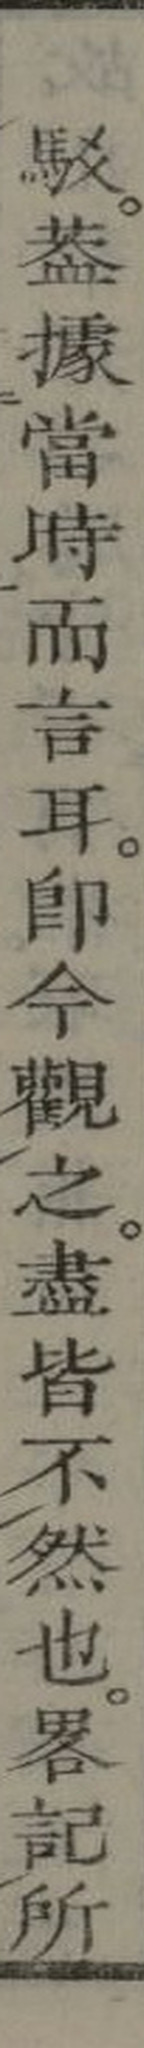駁。葢據當時而言耳。卽今觀之。盡皆不然也。畧記所
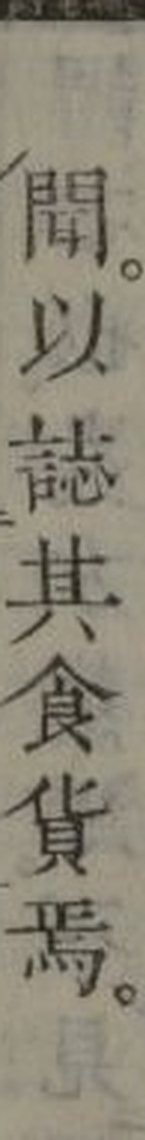聞。以誌其食貨焉。
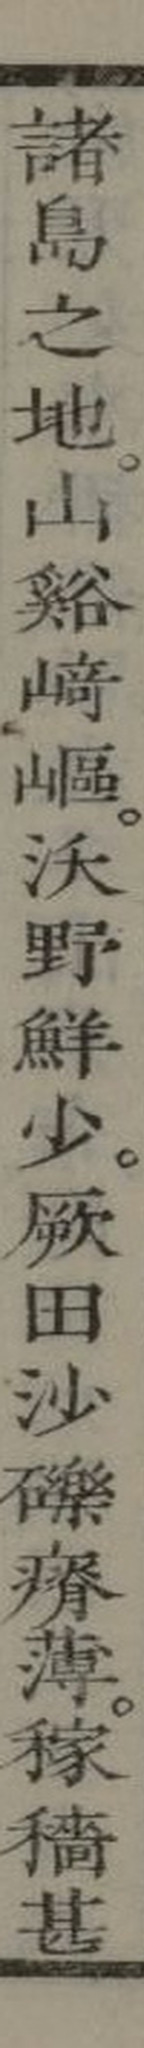諸島之地。山谿﨑嶇。沃野鮮少。厥田沙礫瘠薄。稼穡甚
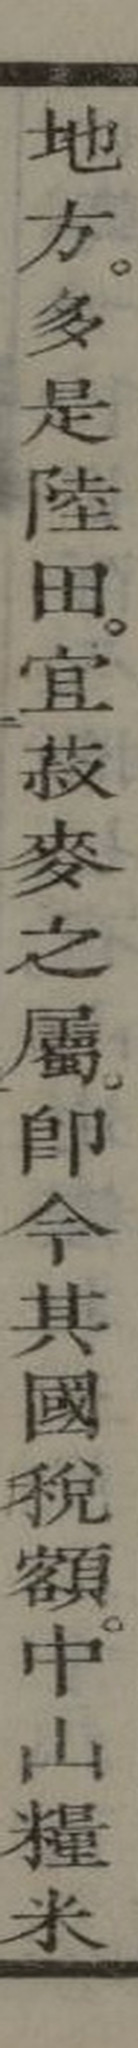地方。多是陸田。宜菽麥之屬。卽今其國稅額。中山糧米

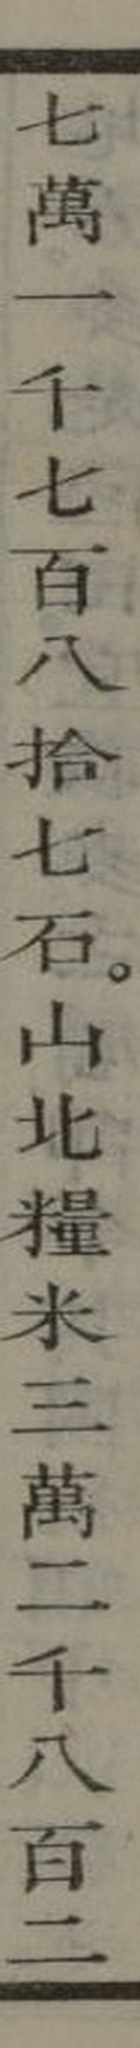七萬一千七百八拾七石。山北糧米三萬二千八百二
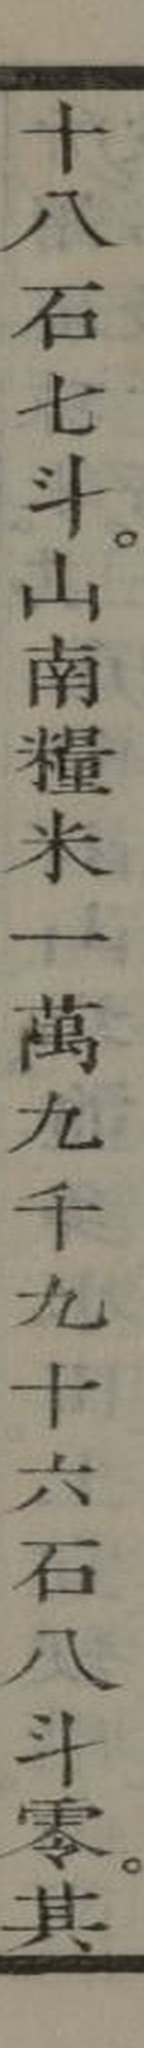十八石七斗。山南糧米一萬九千九十六石八斗零。其
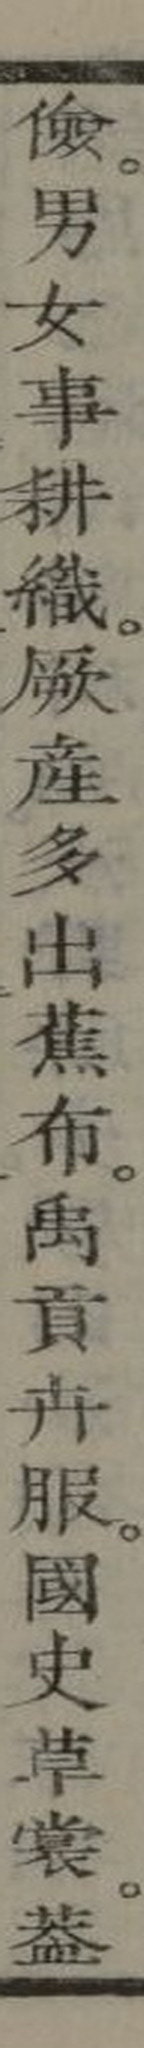儉。男女事耕織。厥産多出蕉布。禹貢卉服。國史草裳。葢
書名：南島志 呂
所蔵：University of the Ryukyus Library
